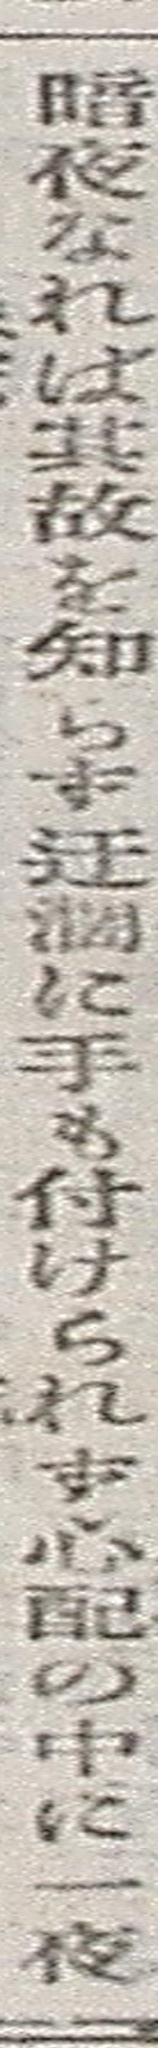暗夜なれば其故を知らず迂闊に手も付けられず心配の中に一夜
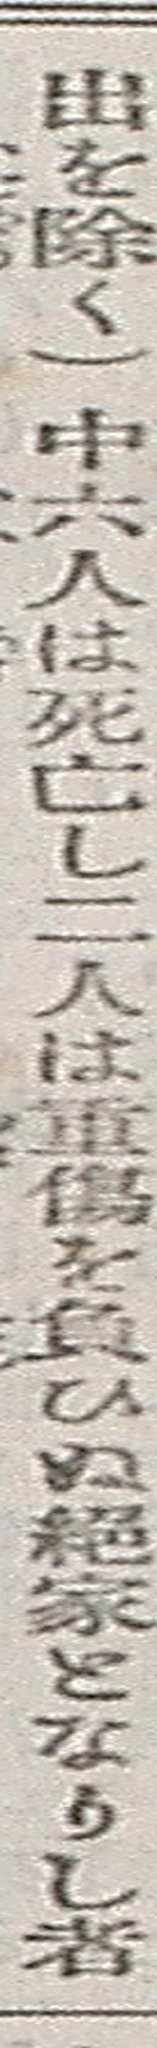出を除く）中六人は死亡し二人は重傷を負ひぬ絶家となりし者
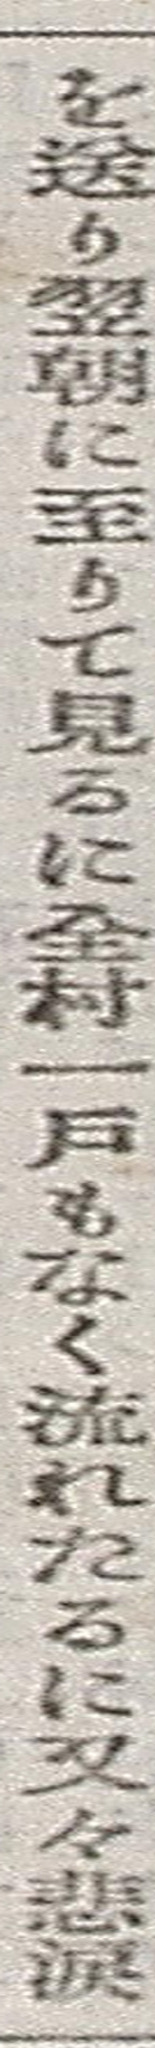を送り翌朝に至りて見るに全村一戸もなく流れたるに又々悲涙
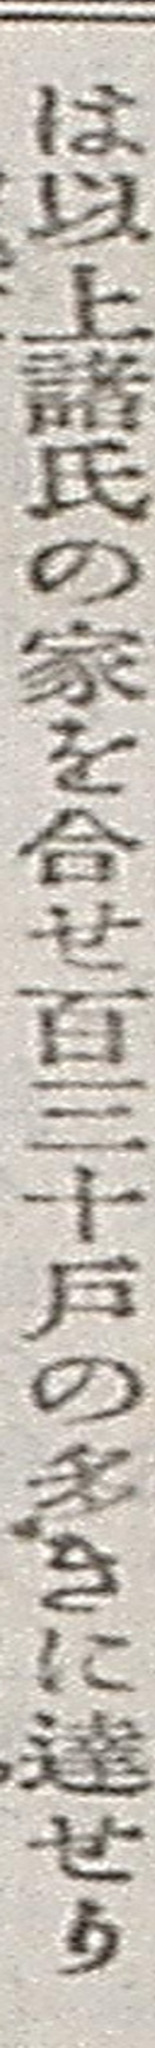は以上諸氏の家を合せ百三十戸の多きに達せり
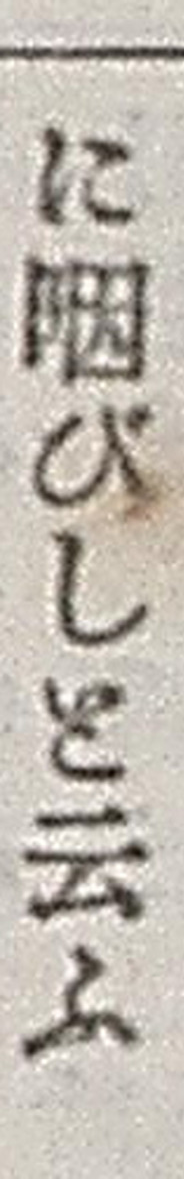に咽びしと云ふ
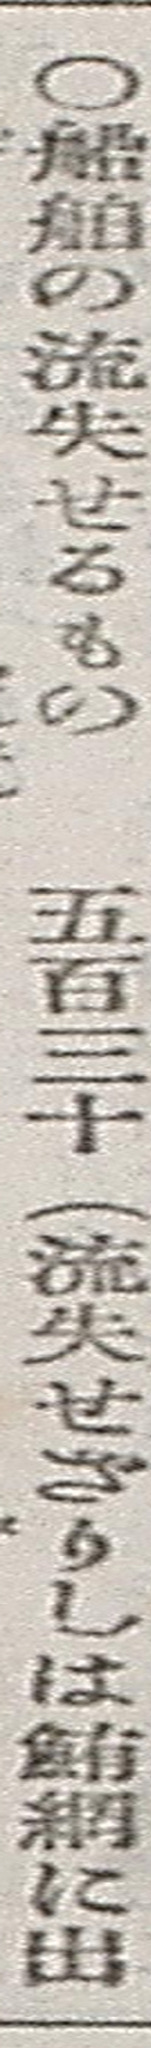○船舶の流失せるもの五百三十せざりしは鮪網に出
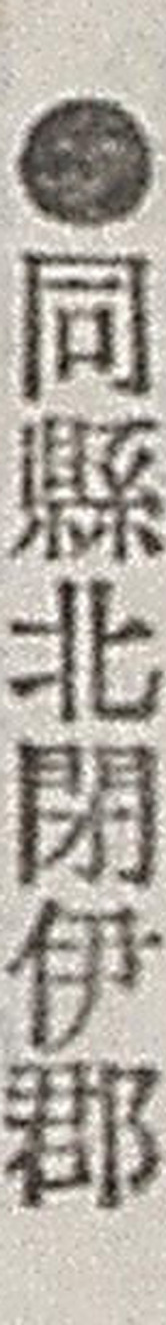●同県北閉伊郡
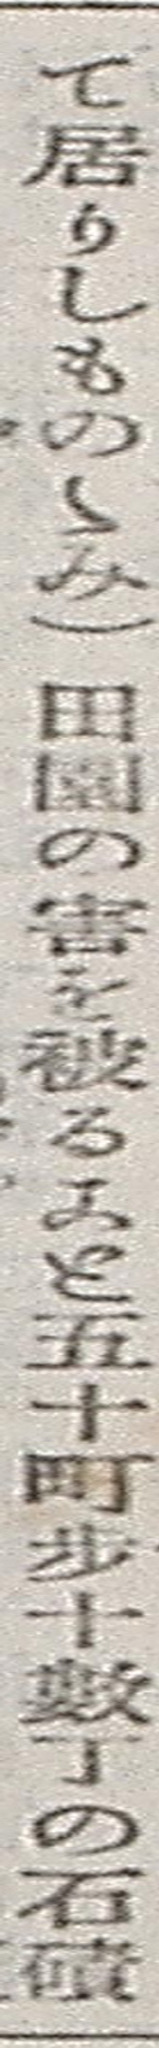て居りしものゝみ）田園の害を被ること五十町歩十数丁の石磧
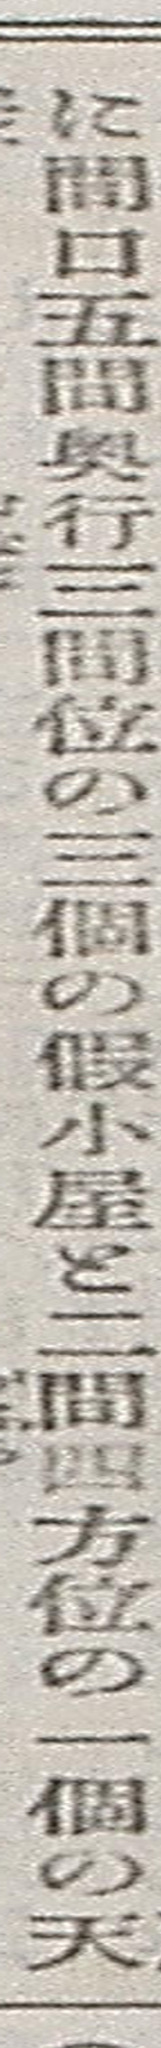に間口五間奥行三間位の三個の仮小屋と二間四方位の一個の天
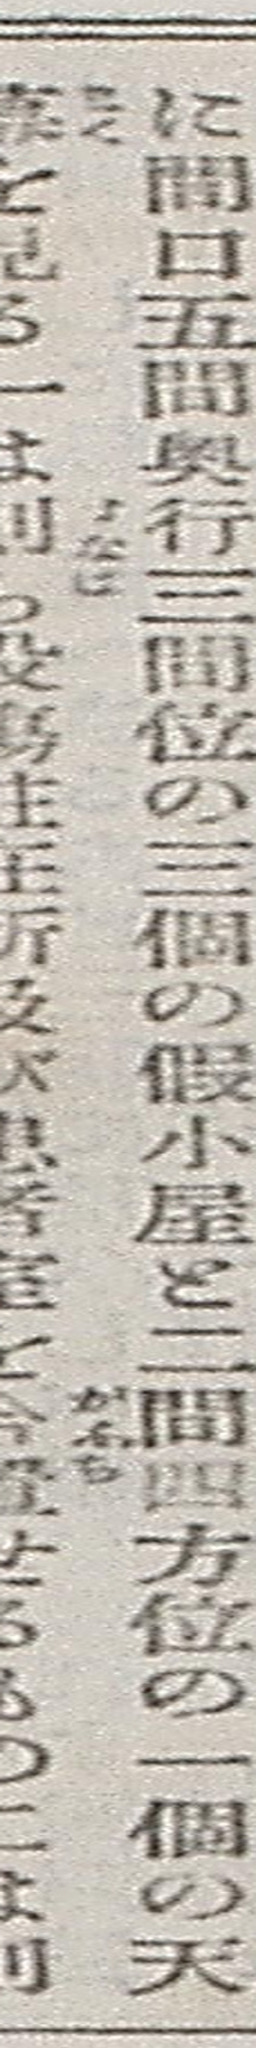幕を見る一は則ち役場駐在所及び患者室を合置せるもの二は則
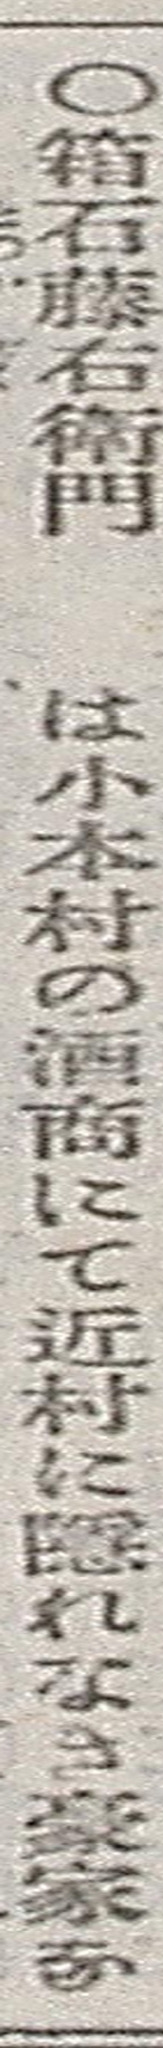○箱石藤右衛門は小本村の酒商にて近村に隠れなき豪家な
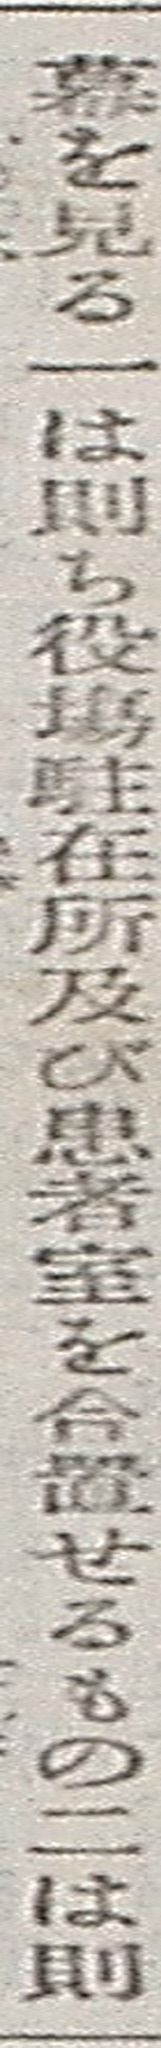幕を見る一は則ち役場駐在所及び患者室を合置せるもの二は則
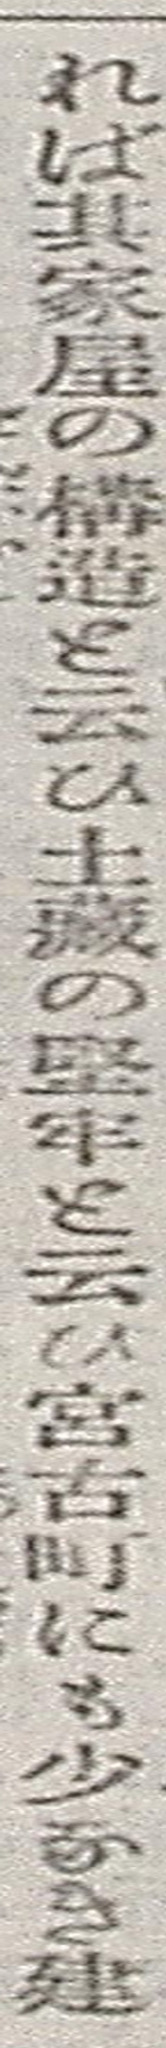れば其家屋の構造と云ひ土蔵の堅牢と云ひ宮古町にも少なき建
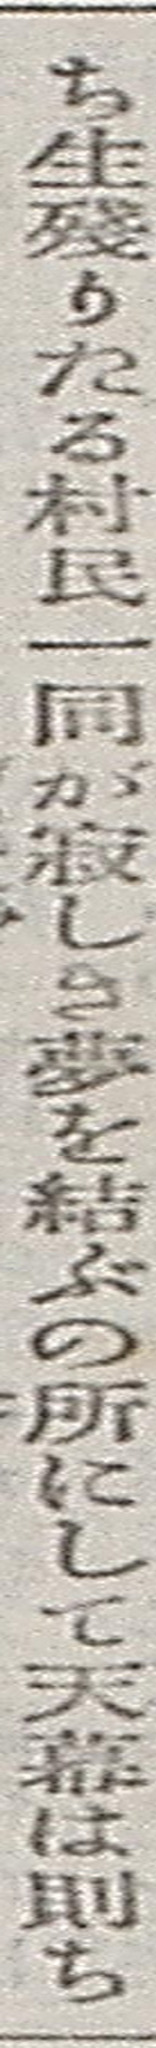ち生残りたる村民一同が寂しき夢を結ぶの所にして天幕は則ち
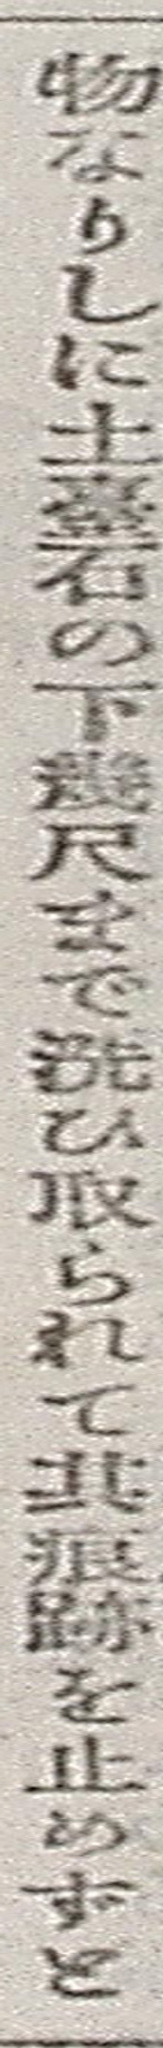物なりしに土台石の下幾尺まで洗ひ取られて其痕跡を止めずと
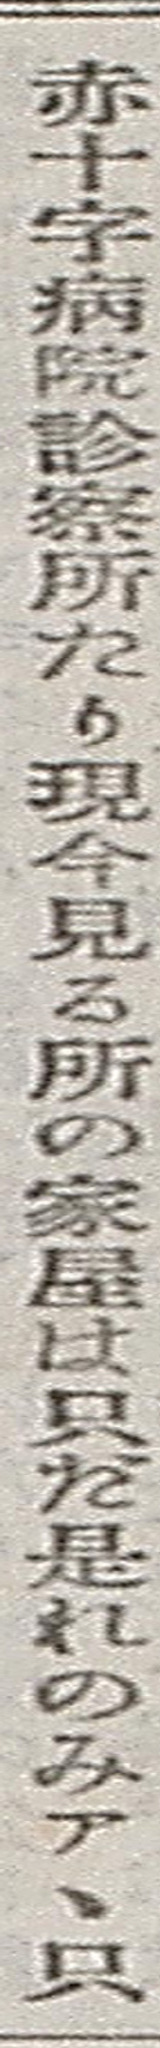赤十字病院診察所たり現今見る所の家屋は只だ是れのみアゝ只
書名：風俗畫報臨時増刊第百二十號　大海嘯被害録（下）
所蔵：東京大学地震研究所図書室 Earthquake Research Institute Library, The University of Tokyo, JAPAN
